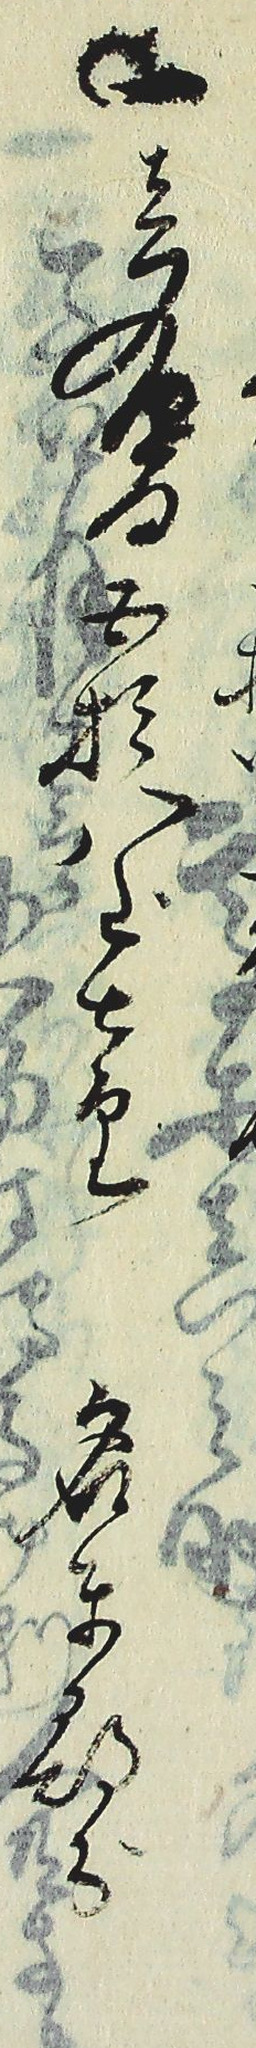一壱〆四百五拾八匁七厘名東郡分
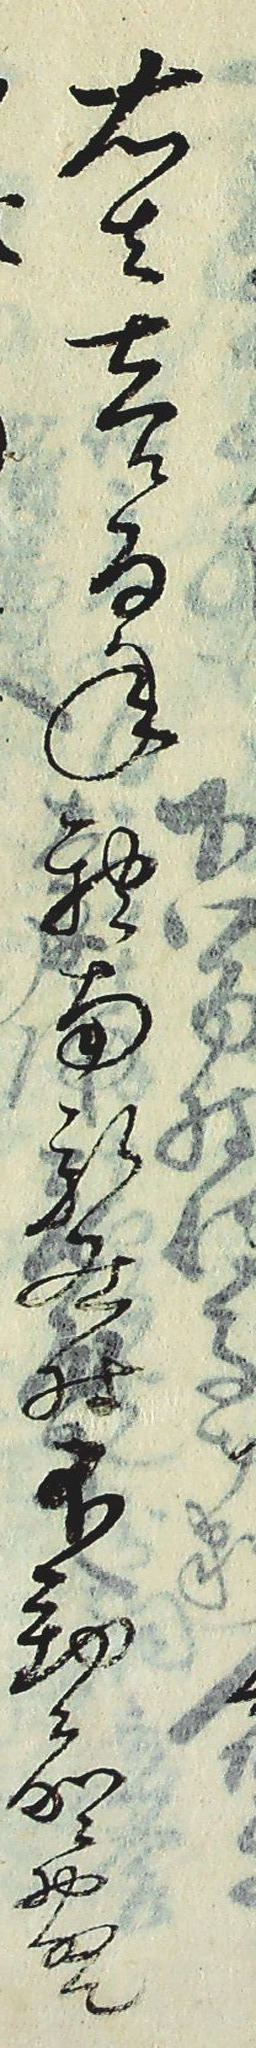右は去る酉年秋南新居村不動前におゐて
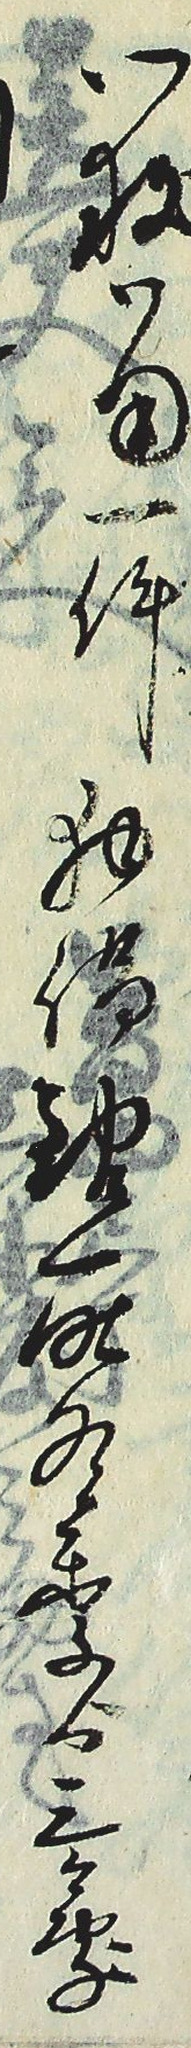御救御用一件拝借銀一昨冬季ゟ三ヶ処
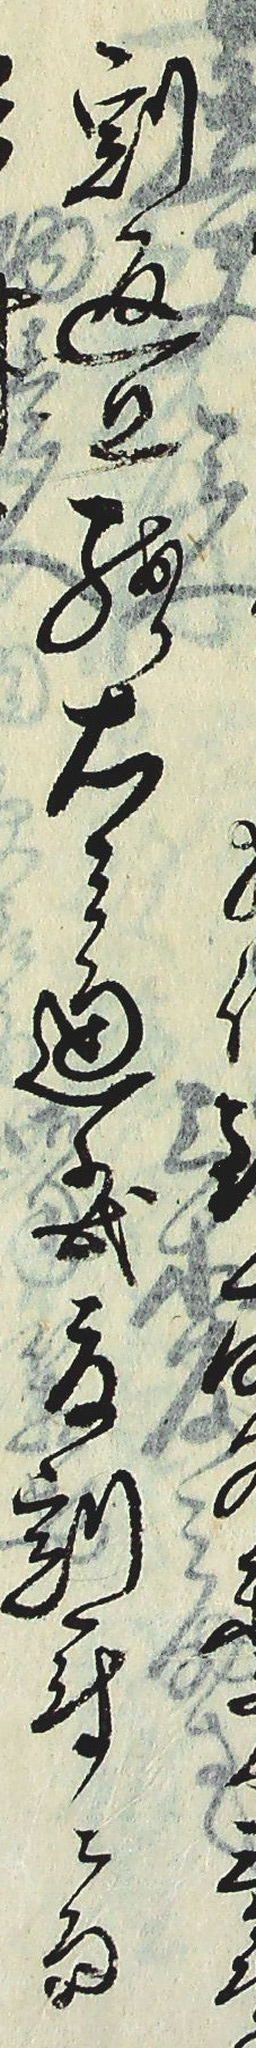割返且残り右之通当夏割苻にて
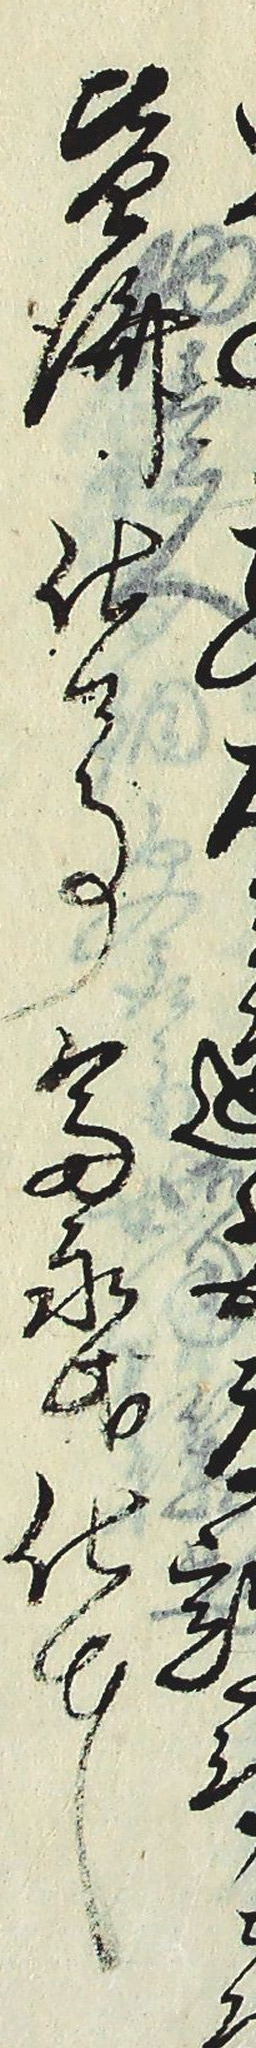皆済仕候事富永氏仕出候
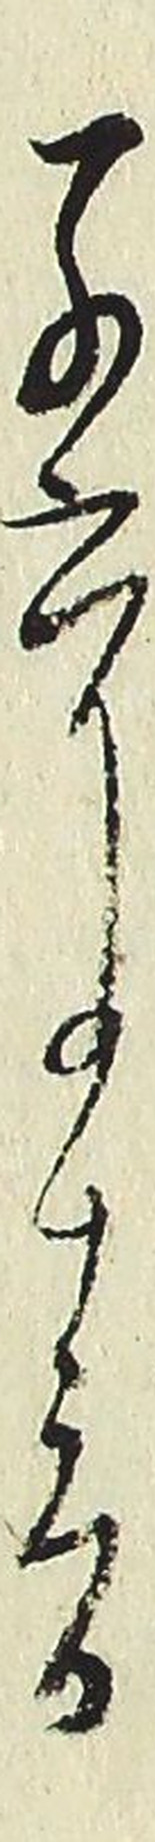子六月十三日

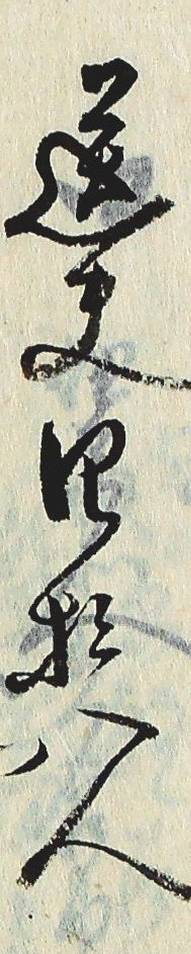送夫四拾八人
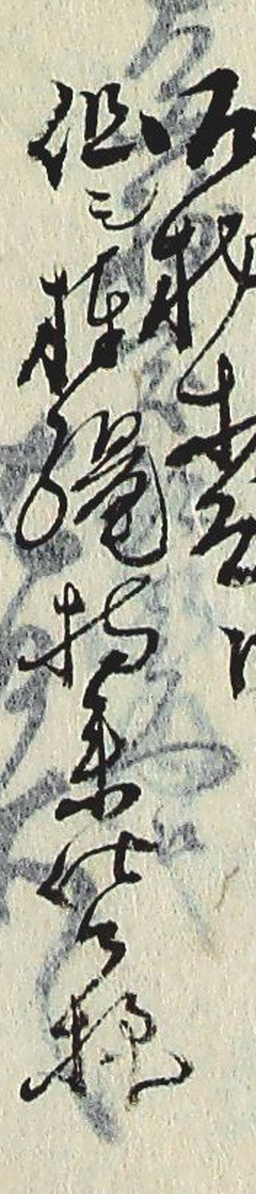但し棟縄持参仕候様
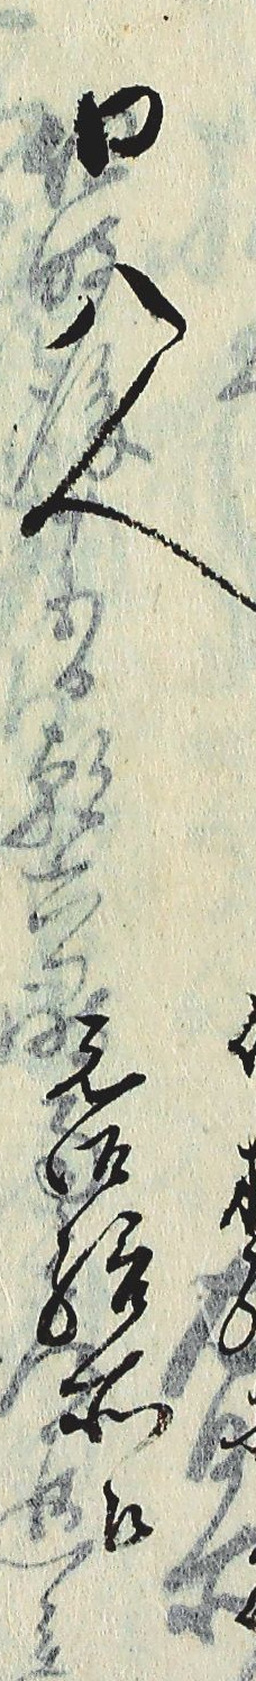内八人元御繕所え
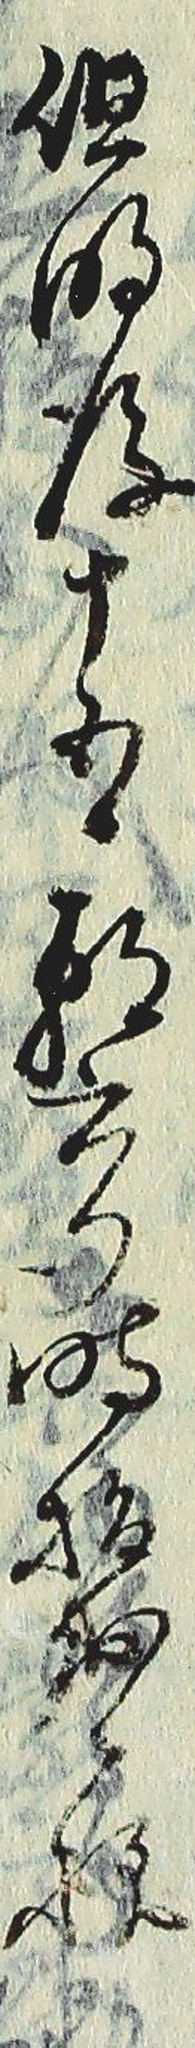但明後十五日朝六つ時指出候様
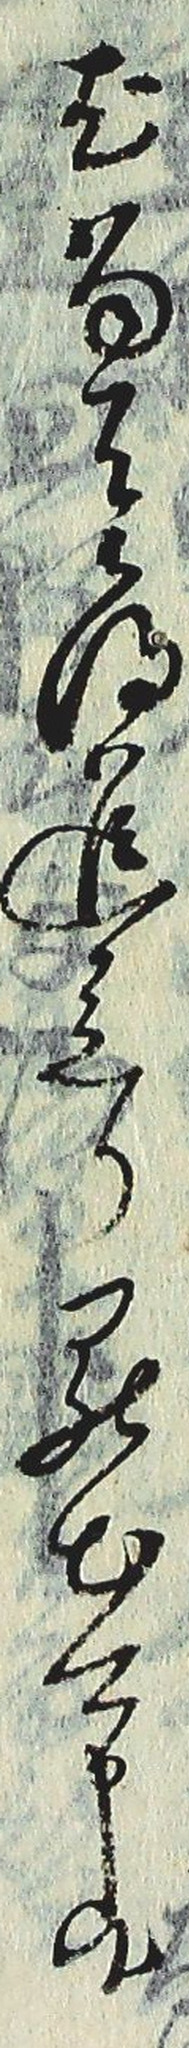尤雨天候得は追送り罷出可申候
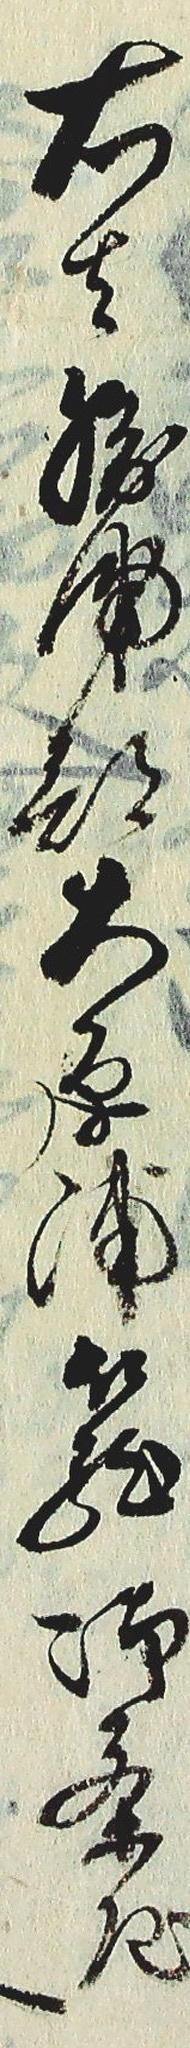右は勝浦郡大原浦籠御茶屋
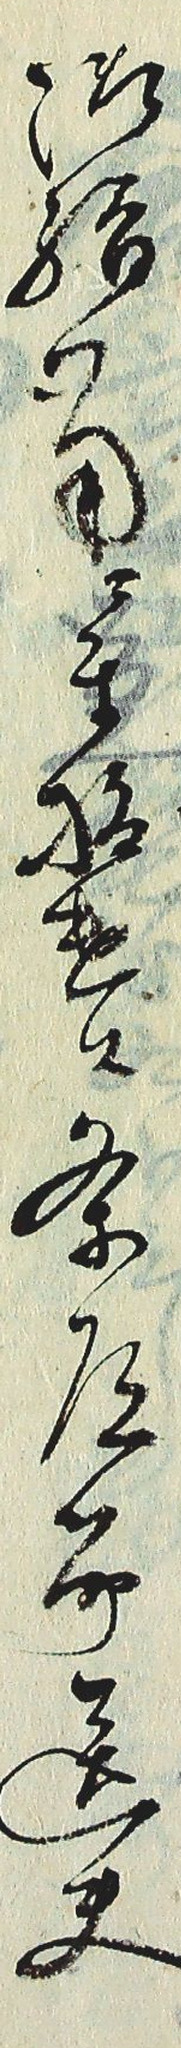御繕御用に付指遣候条茶屋前送夫
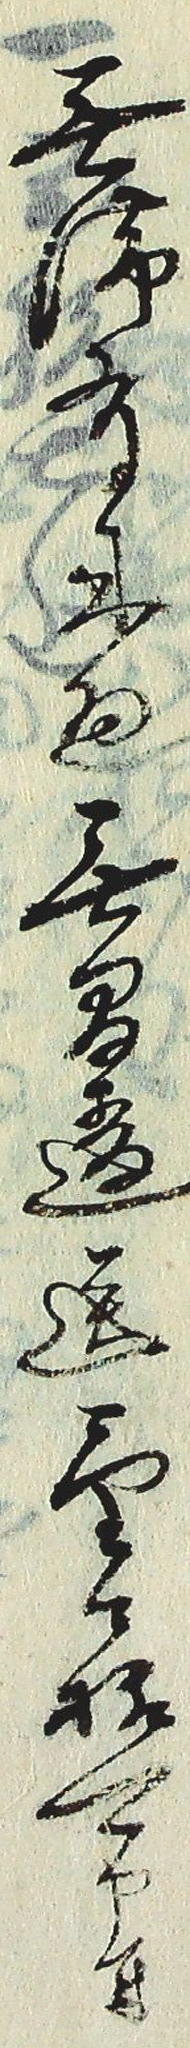無滞有来通無間違送届候様可申付
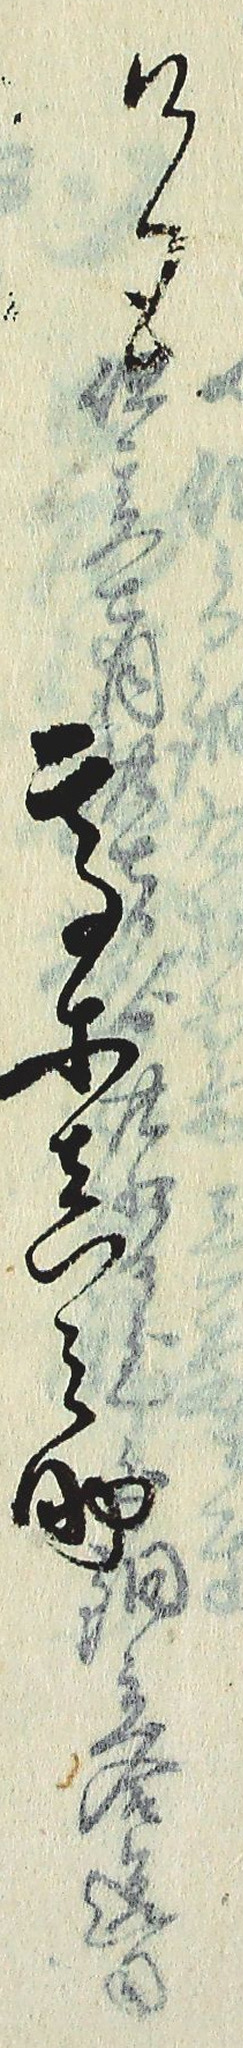高木真之助
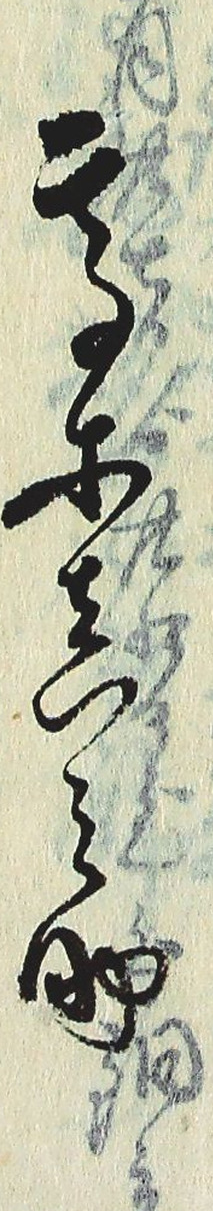高木真之助
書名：名東郡中諸割賦元帳
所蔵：鳴門教育大学 Naruto University of Education
